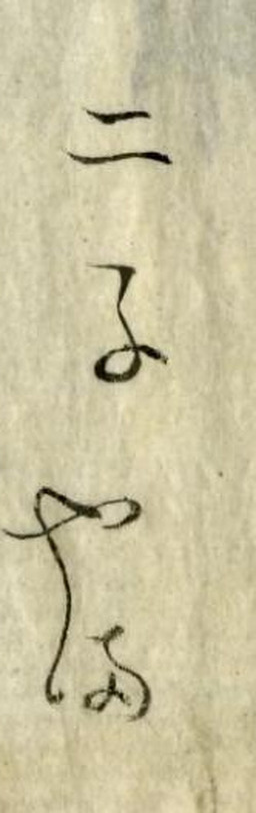二子やま
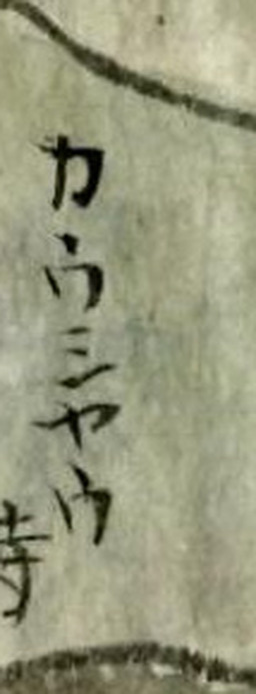カウシヤウ

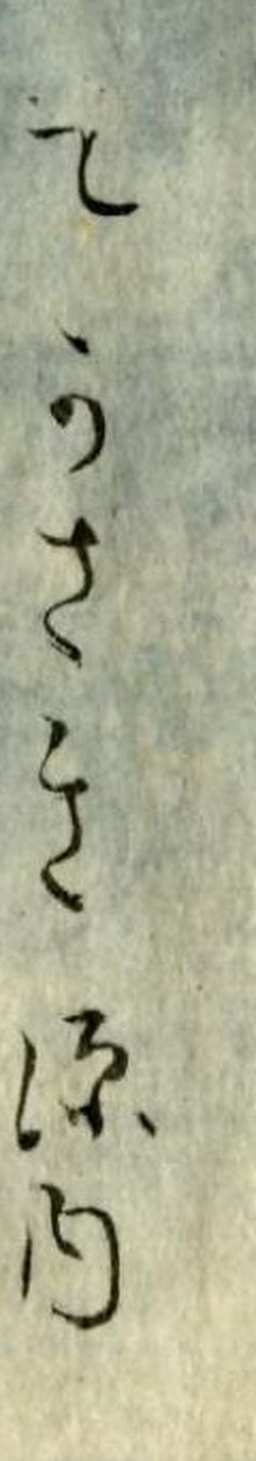乙かさき源内
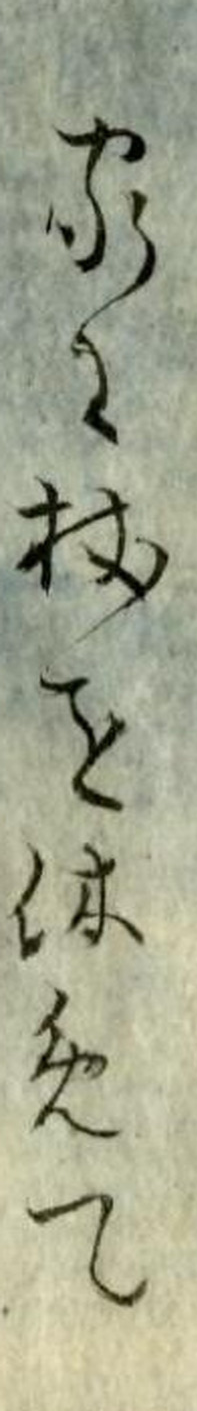家に杖を休めて
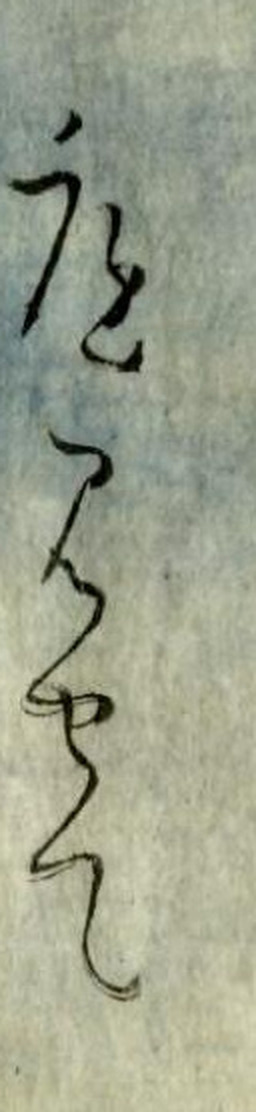庭見せて

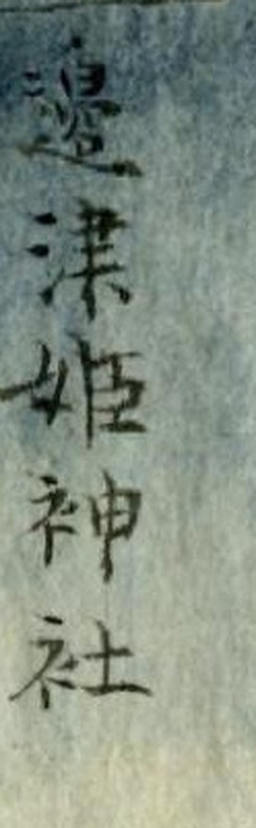邉津姫神社
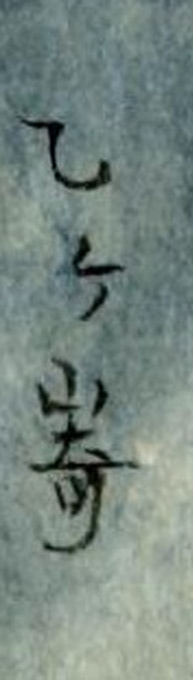乙ケ㟢

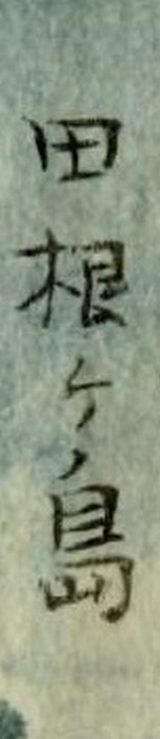田根ヶ島
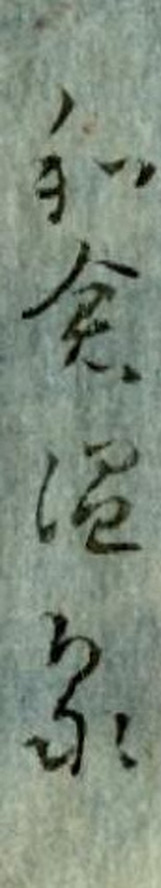和倉温泉
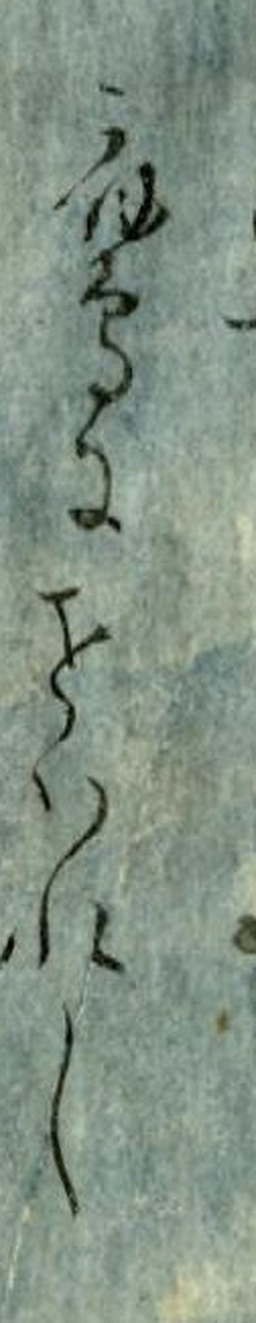鷹にをはれし
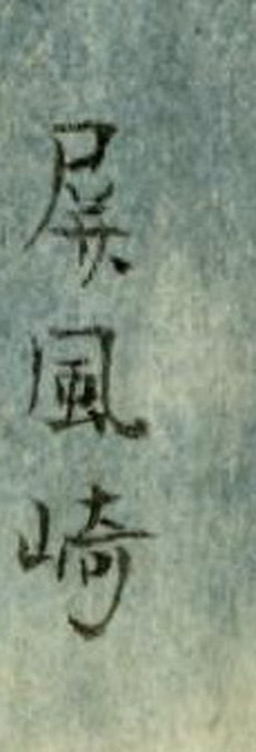屏風崎
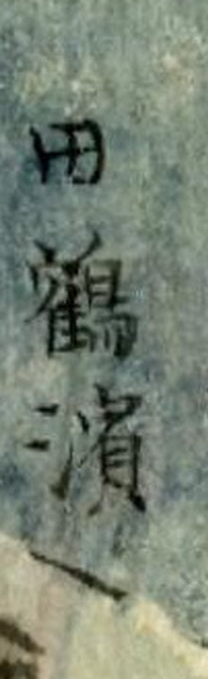田鶴濱
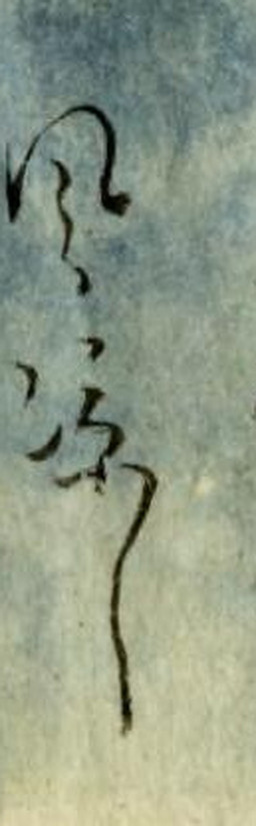風凉し

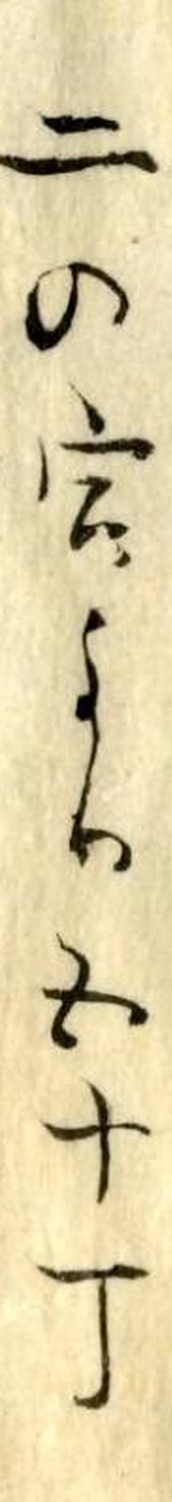二の宮より五十丁
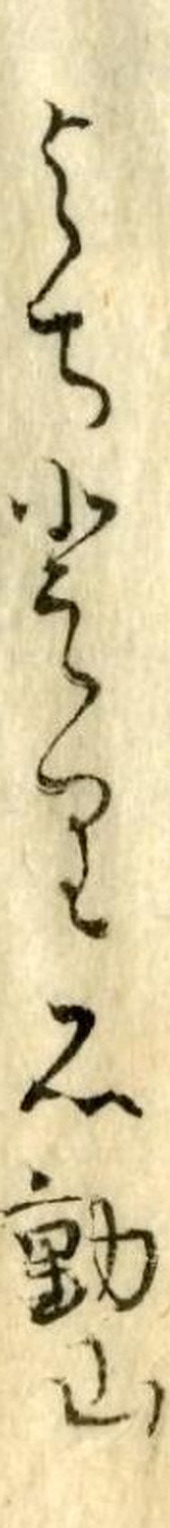よち登り石動山
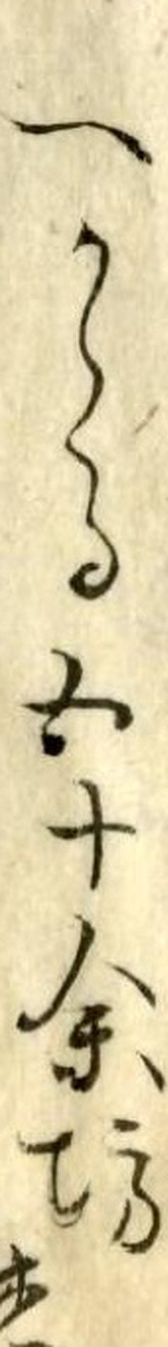へかくる五十余坊
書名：能登めぐり
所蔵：Ishikawa Prefectural Library
